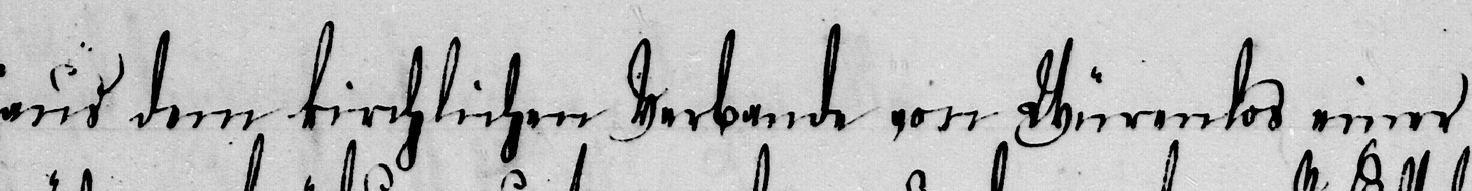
aus dem kirchlichen Verbande von Würenlos einer
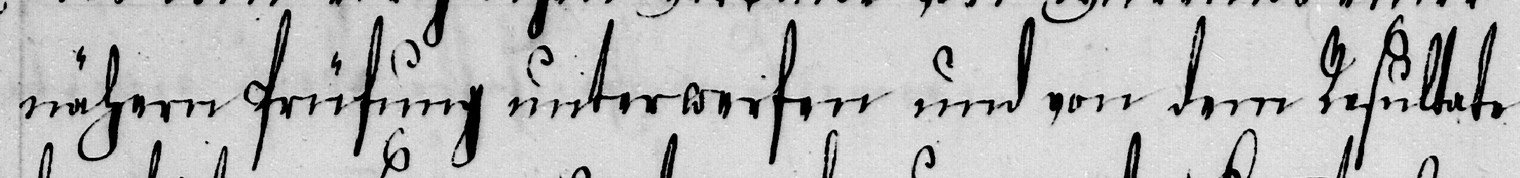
nähern Prüfung unterwerfen und von dem Resultate
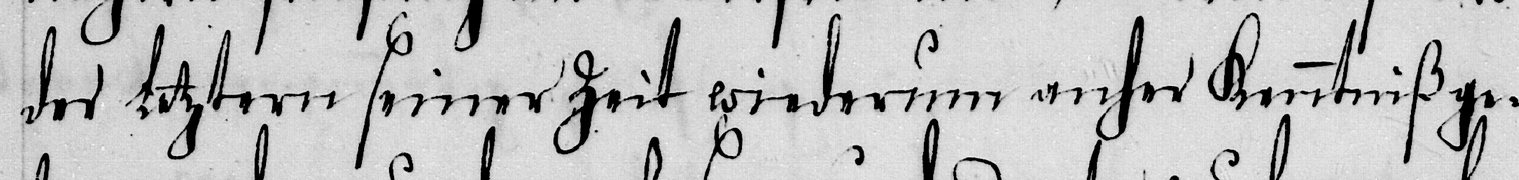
der Letztern seiner Zeit wiederum anher Kenntniß ge¬
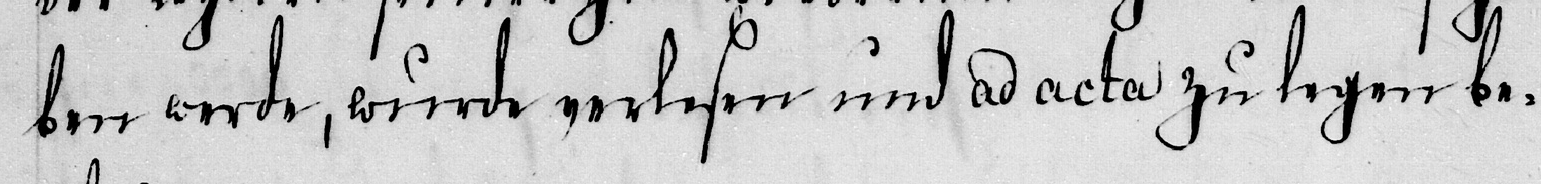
ben werde, wurde verlesen und ad acta zu legen bes¬
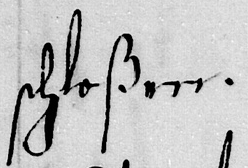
chloßen.
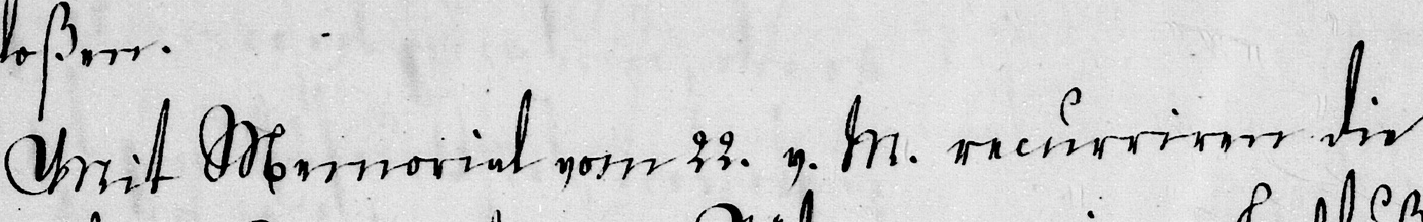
Mit Memorial vom 22. v. M. recurriren die
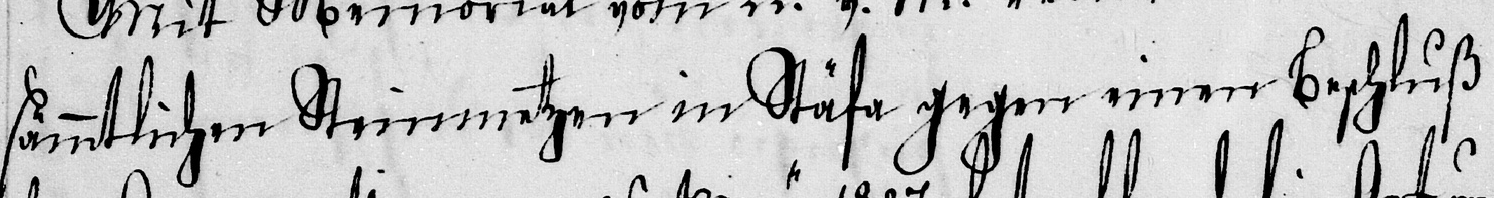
sämmtlichen Steinmetzen in Stäfa gegen einen Beschluß
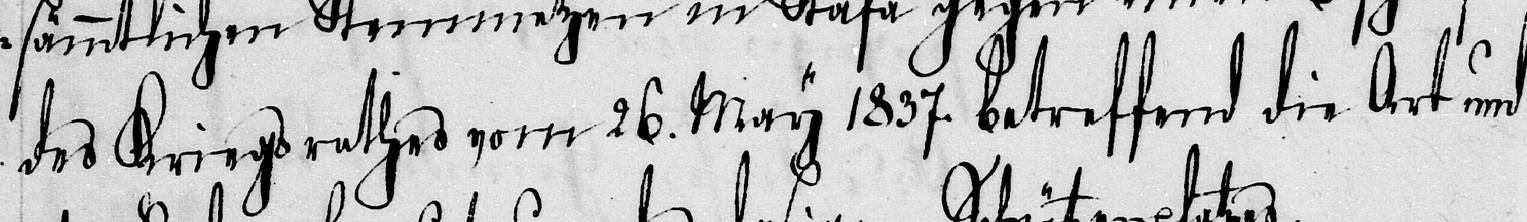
der Kriegsrathes vom 26. März 1837. betreffend die Art und
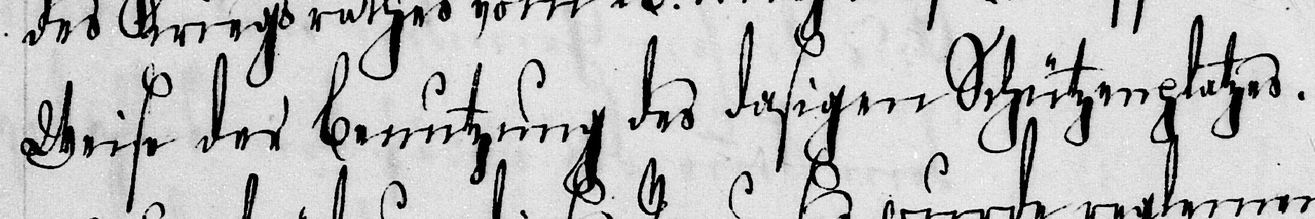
Weise der Benutzung des dasigen Schützenplatze¬
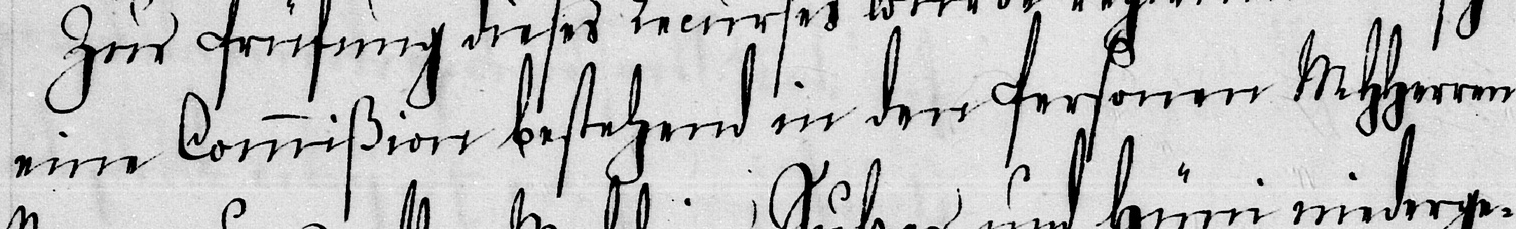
eine Commißion bestehend in den Personen MHHerren
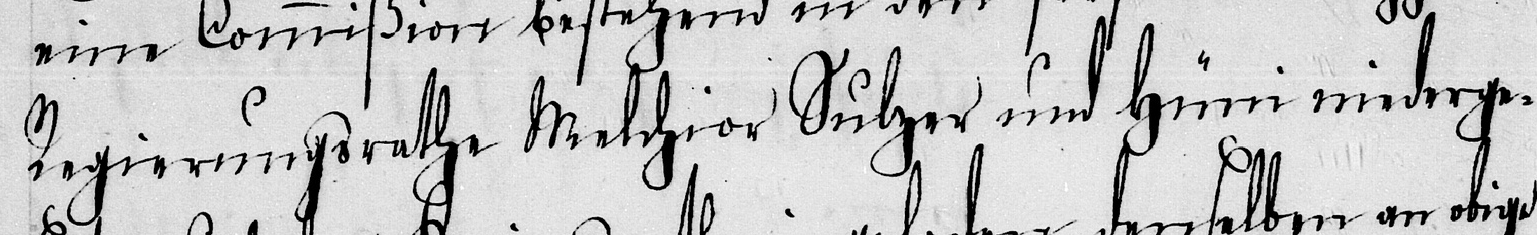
Regierungsrathe Melchior Sulzer und Hüni niederges¬
